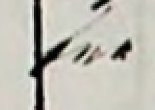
see
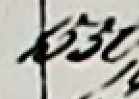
1550,4
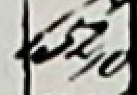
152,0
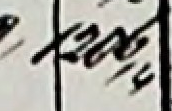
1206,4
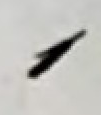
1
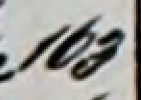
163
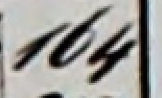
164
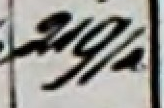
219/a
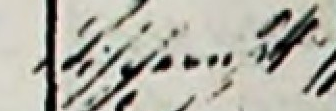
Fischern„
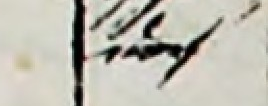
dorf
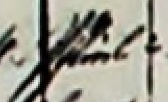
Pflinds=
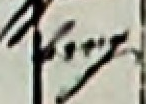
berg
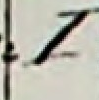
I
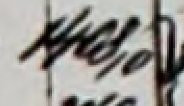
1408,0
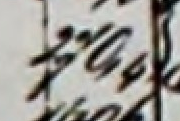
270,4
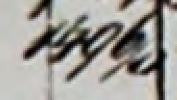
1496,0
